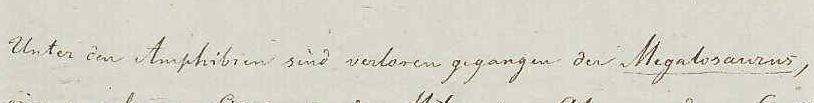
Unter den Amphibien sind verloren gegangen der Megalosaurus,
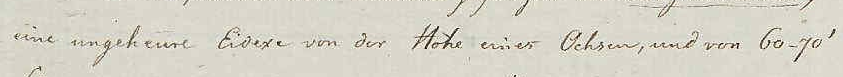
eine ungeheure Eidexe von der Höhe eines Ochsen, und von 60–70′
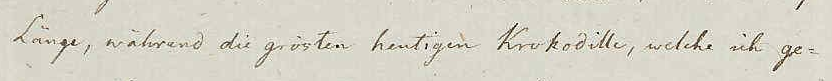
Länge, während die grösten heutigen Krokodille, welche ich ge-
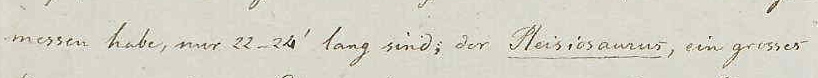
messen habe, nur 22–24′ lang sind; der Pleisiosaurus, ein grosses
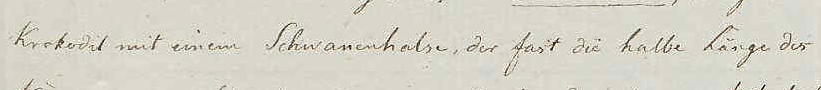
Krokodil mit einem Schwanenhalse, der fast die halbe Länge des
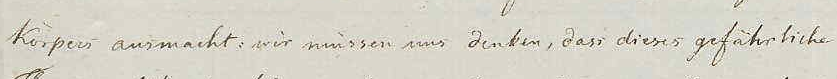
Körpers ausmacht: wir müssen uns denken, dass dieses gefährliche
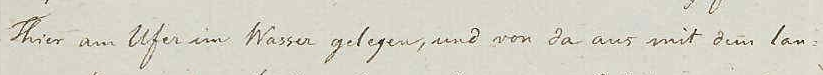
Thier am Ufer im Wasser gelegen, und von da aus mit dem lan-
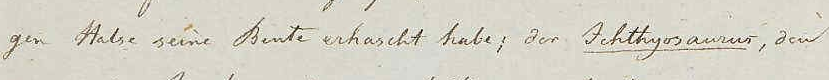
gen Halse seine Beute erhascht habe; der Ichthyosaurus, den
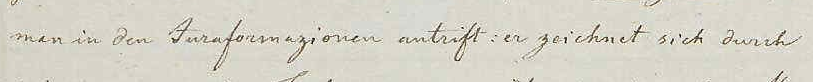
man in den Juraformazionen antrift: er zeichnet sich durch
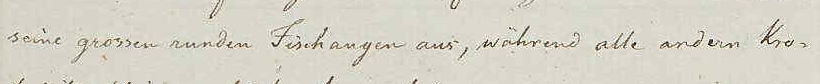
seine grossen runden Fischaugen aus, während alle andern Kro-
